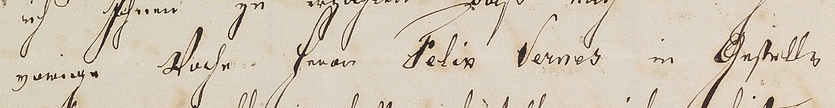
vorige Woche Herrn Felix Vernes in Gesell-
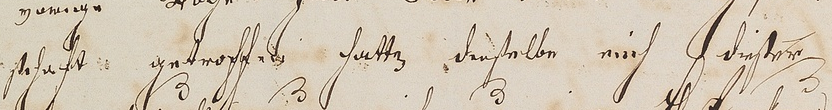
schaft getroffen hatte, derselbe mich dieser
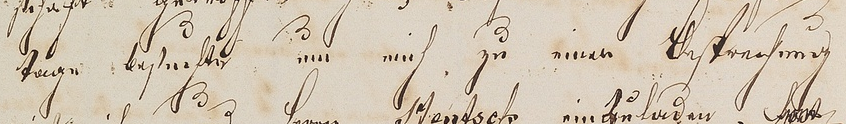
Tage besuchte um mich zu einer Besprechung
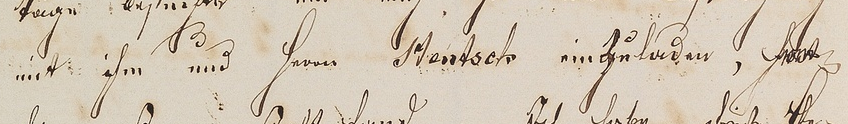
mit ihm und Herrn Hentsch einzuladen, h...
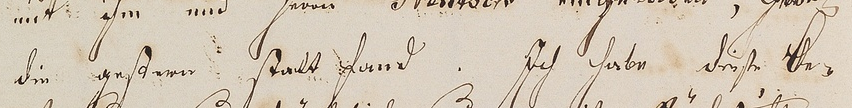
die gestern statt fand. Ich habe diese Be-
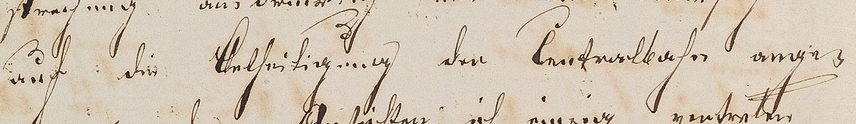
auf die Betheiligung der Centralbahn ange-
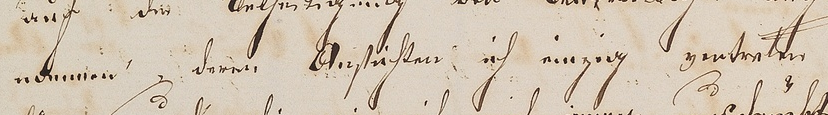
nommen, deren Ansichten ich einzig vertreten
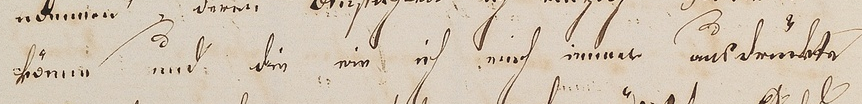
könne und die wie ich mich immer ausdrückte
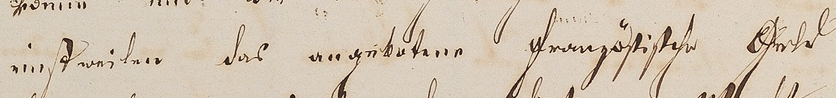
einstweilen das angebotene französische Geld
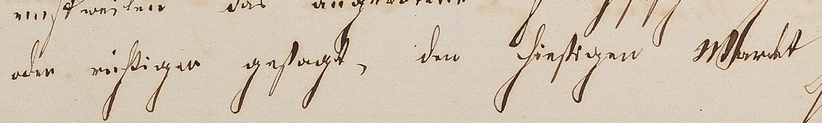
oder richtiger gesagt, den hiesigen Markt
